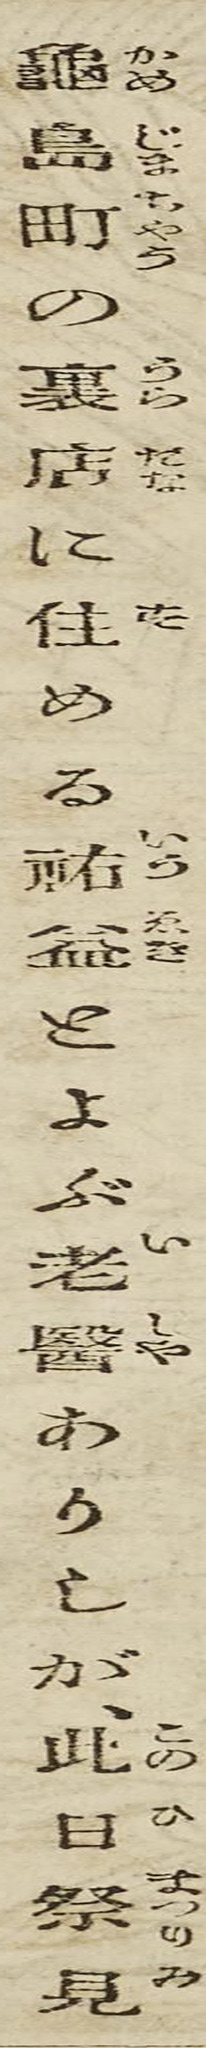亀島町の裏店に住める祐益とよぶ老医ありしが、此日祭見
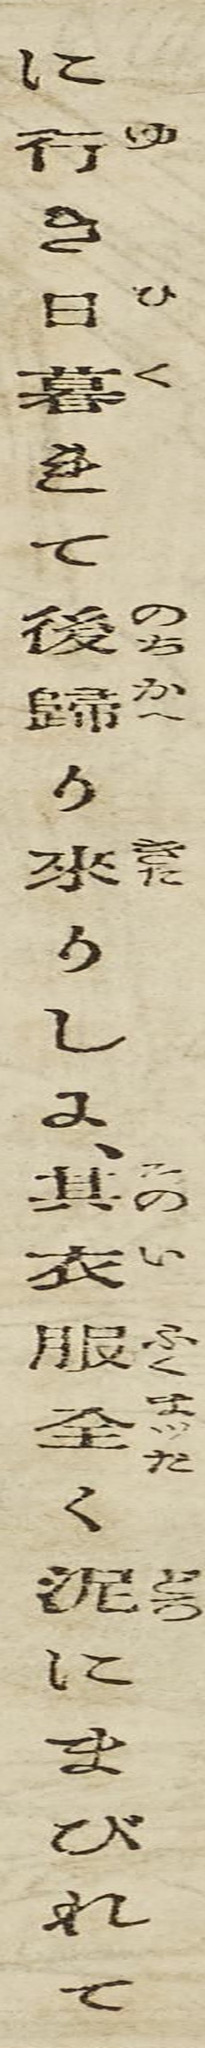に行き日暮れて後帰り来りしに、其衣服全く泥にまびれて
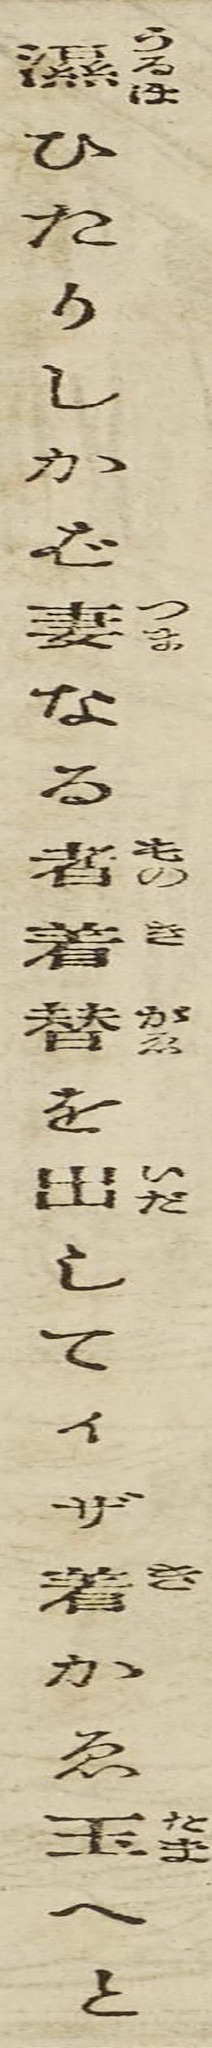湿ひたりしかば妻なる者着替を出してイザ着かゑ玉へと
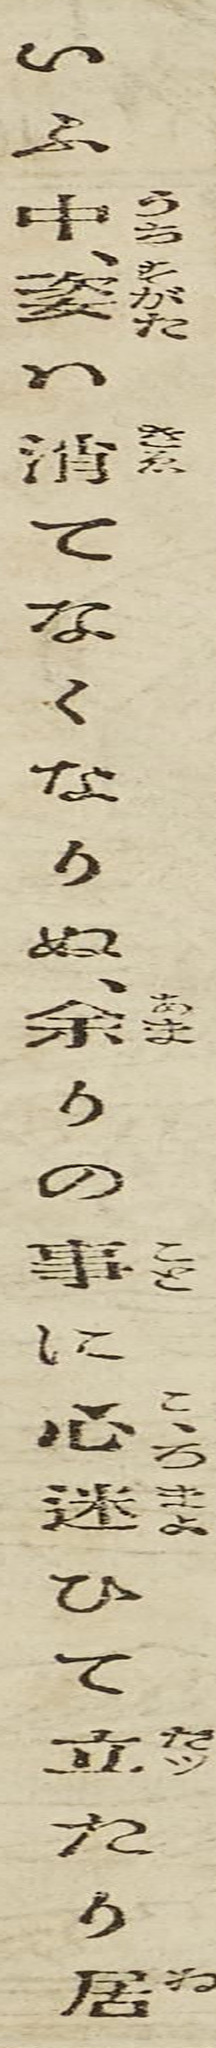いふ中、姿は消てなくなりぬ、余りの事に心迷ひて立たり居
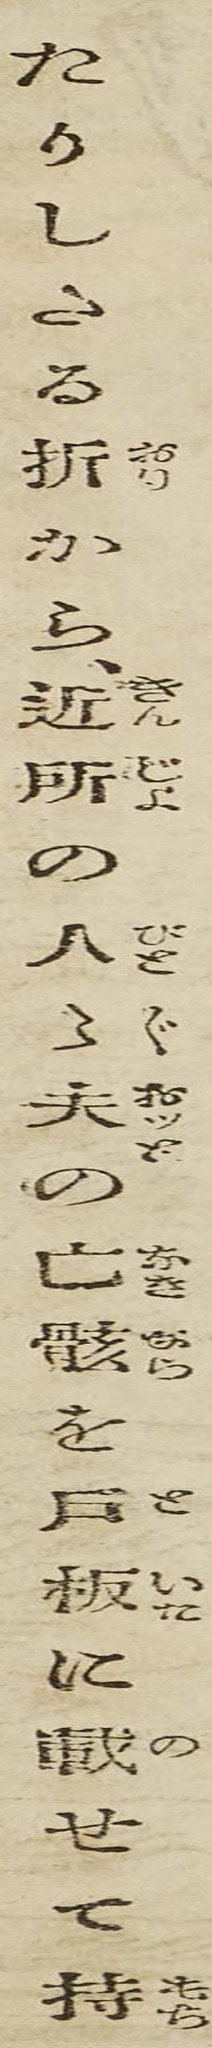たりしたる折から、近所の人〻夫の亡骸を戸板に載せて持

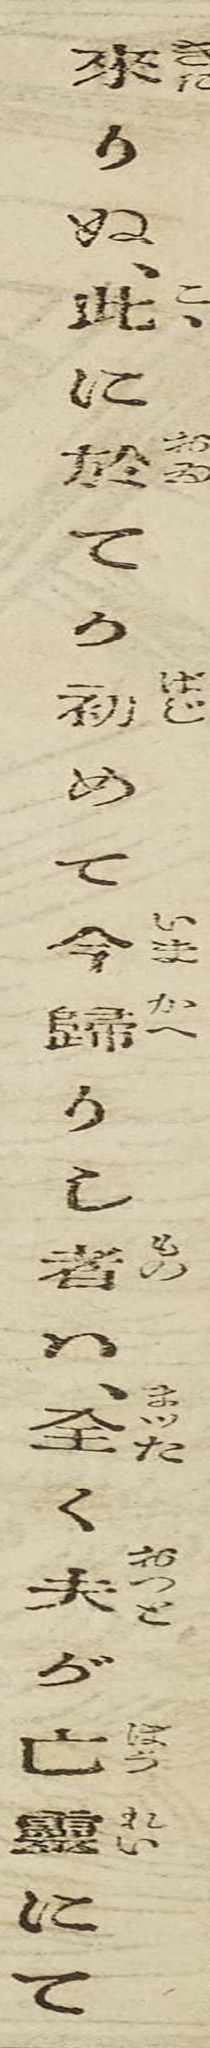来りぬ、此に於てか初めて今帰りし者は、全く夫が亡霊にて
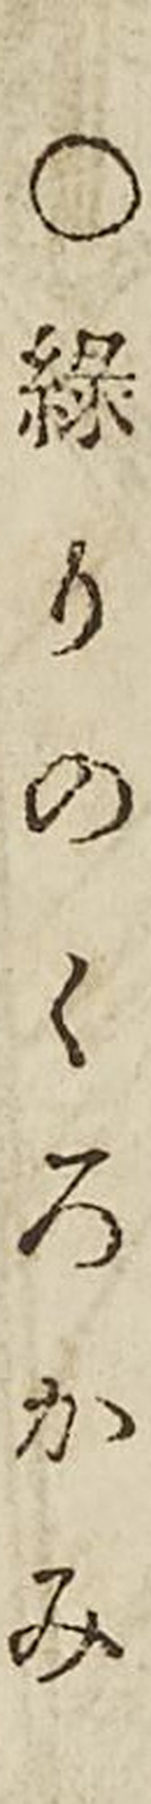○緑りのくろかみ
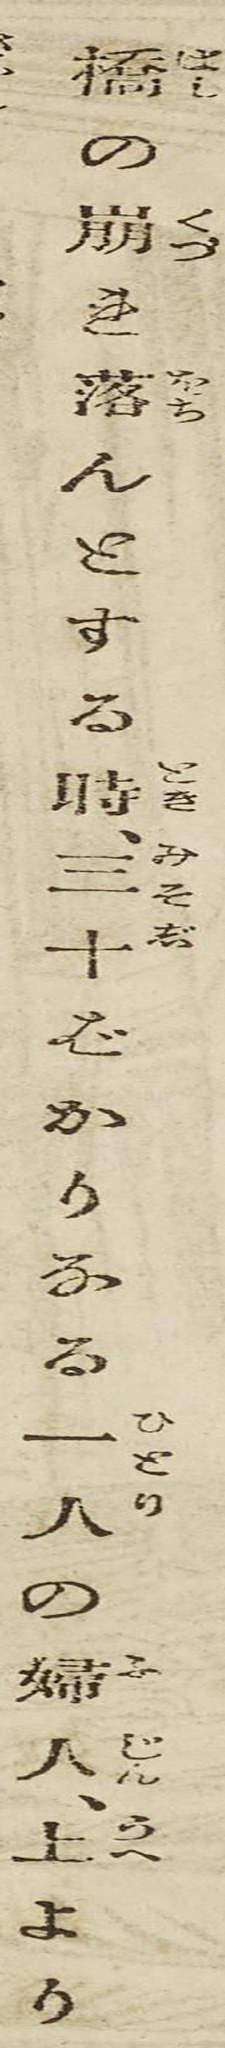橋の崩れ落んとする時、三十ばかりなる一人の婦人、上より
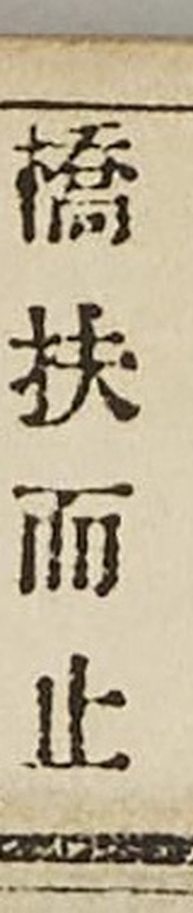橋扶而止
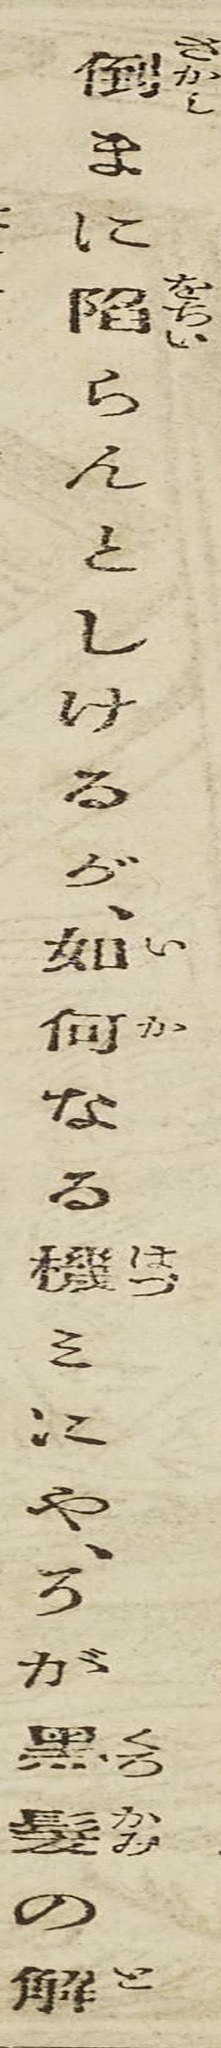倒まに陥らんとしけるが、如何なる機みにや、そが黒髪の解
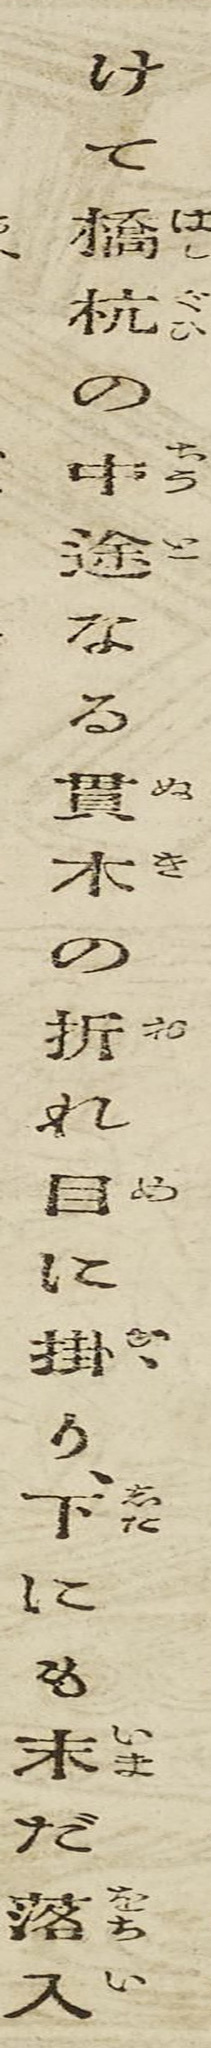けて橋杭の中途なる貫木の折れ目に掛り、下にも未だ落入
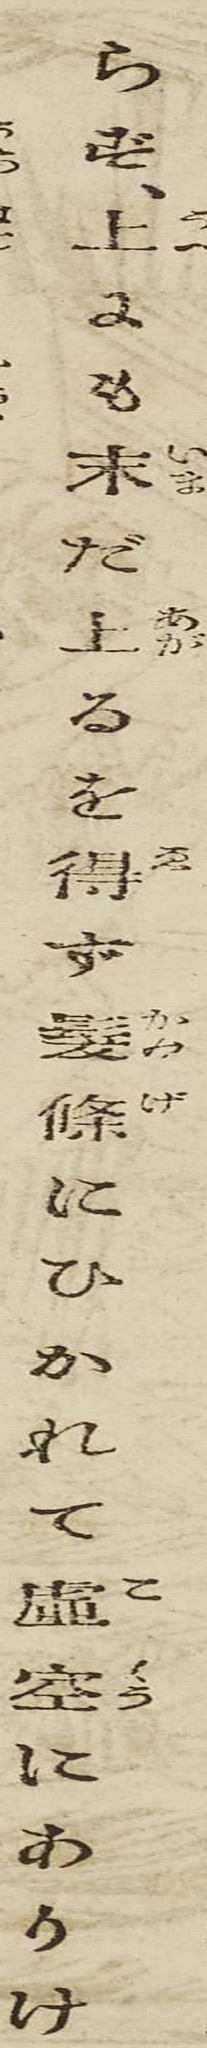らず、上にも未だ上るを得ず髪條にひかれて虚空にありけ
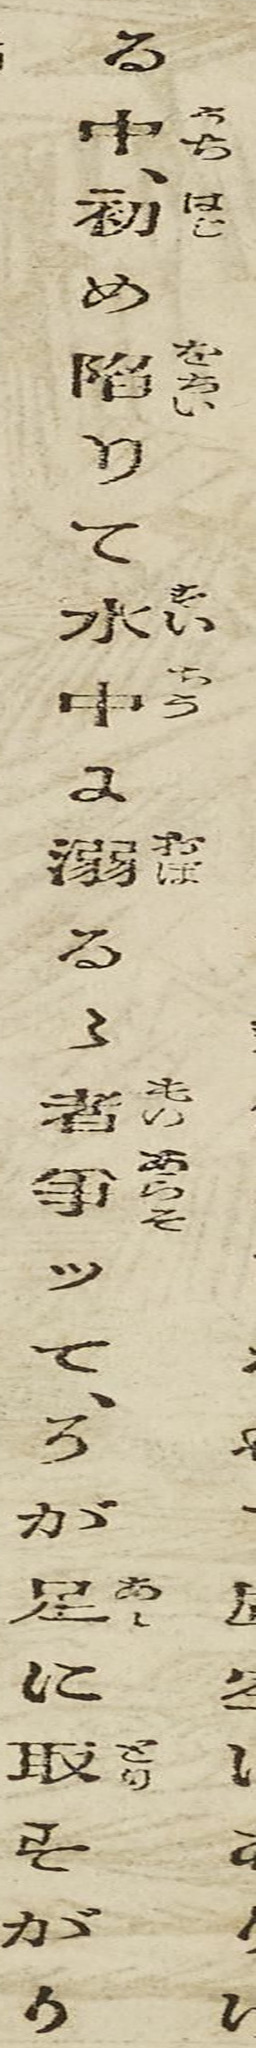る中、初め陥りて水中に溺る〻者争ツて、そが足に取すがり
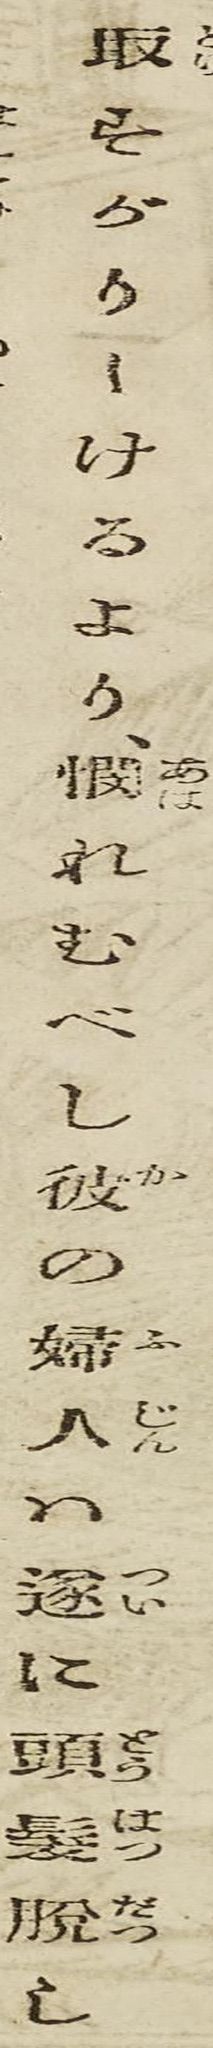取すがりしけるより、憫れむべし彼の婦人は遂に頭髪脱し
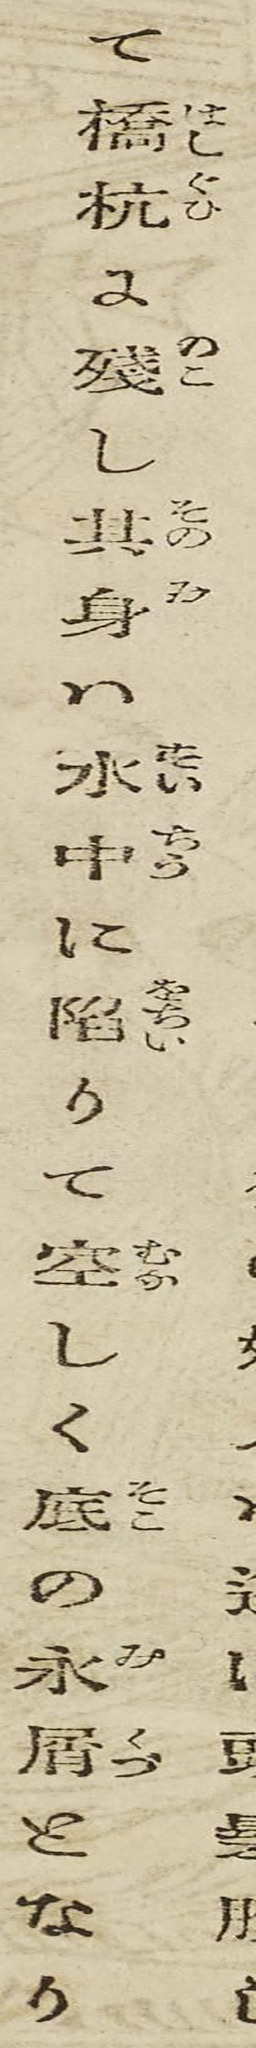て橋杭に残し其身は水中に陥りて空しく底の永屑となり
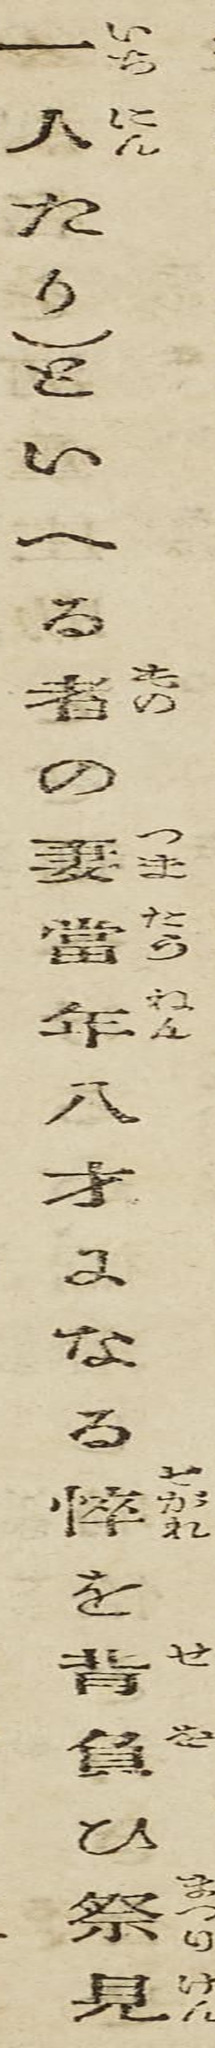一人たり）といへる者の妻当年八才になる悴を背負ひ祭見
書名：永代惨話　文化の夢　全
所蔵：東京大学地震研究所図書室 Earthquake Research Institute Library, The University of Tokyo, JAPAN
